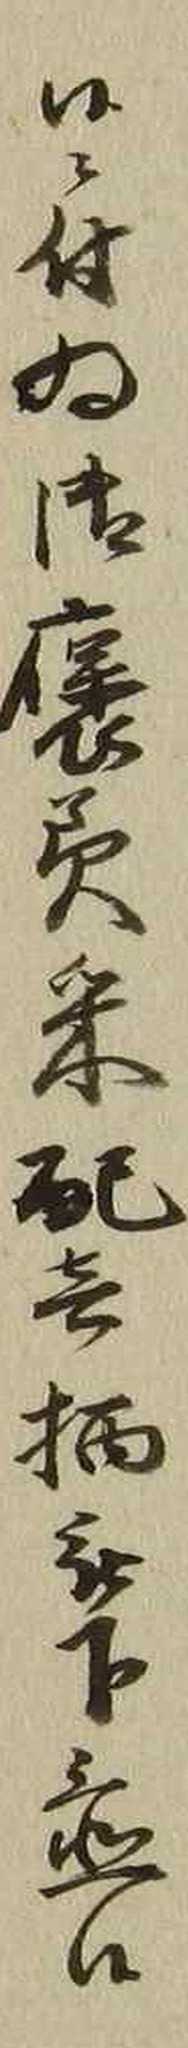候に付為御褒美采配壱柄被下置候
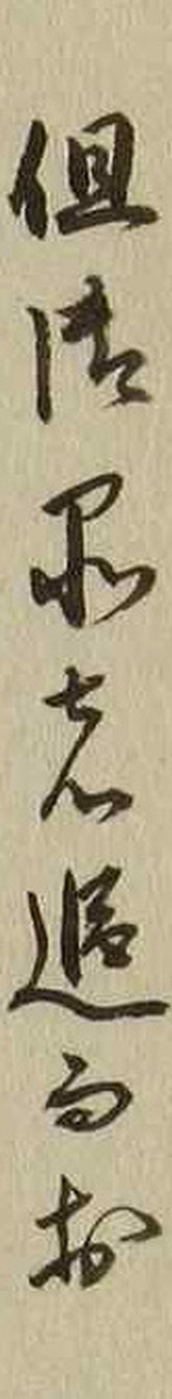但御品は追而於
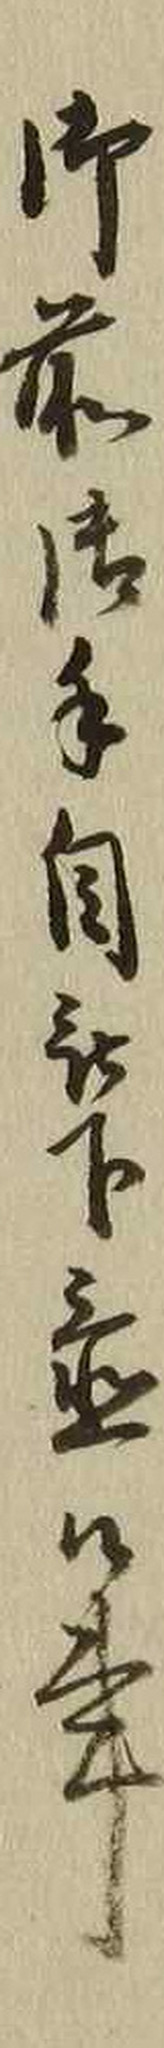御前御手自被下置候事
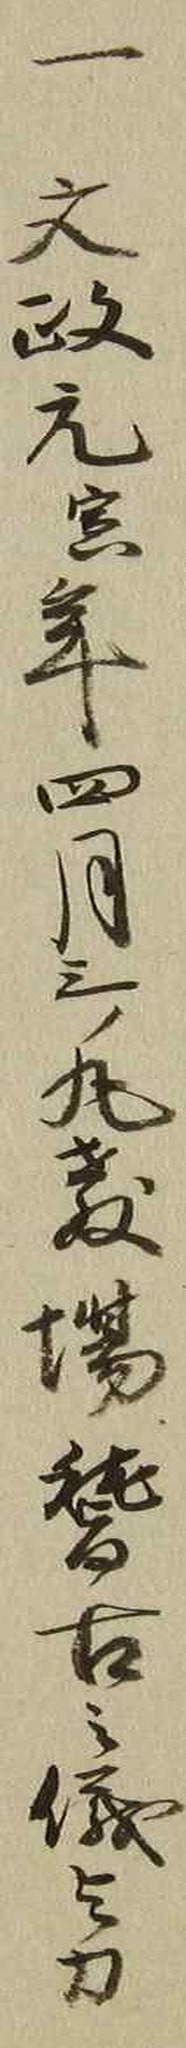一文政元寅年四月三ノ丸教場稽古之儀与力
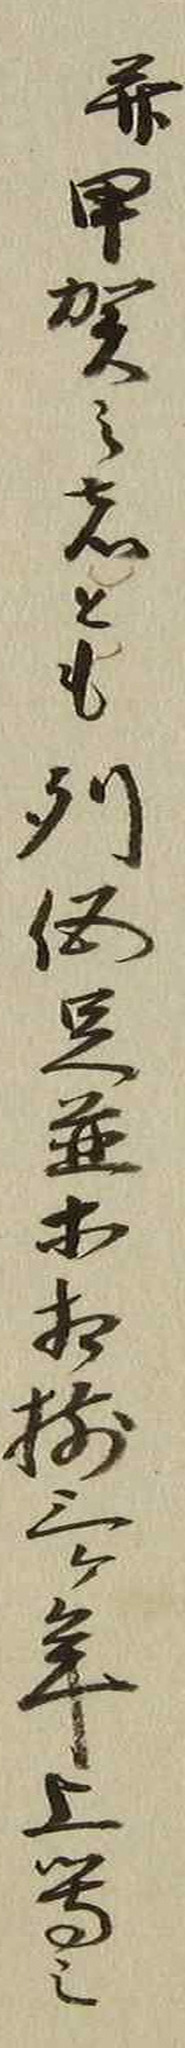并甲賀之者とも列伍足並等相揃三ヶ年上等之
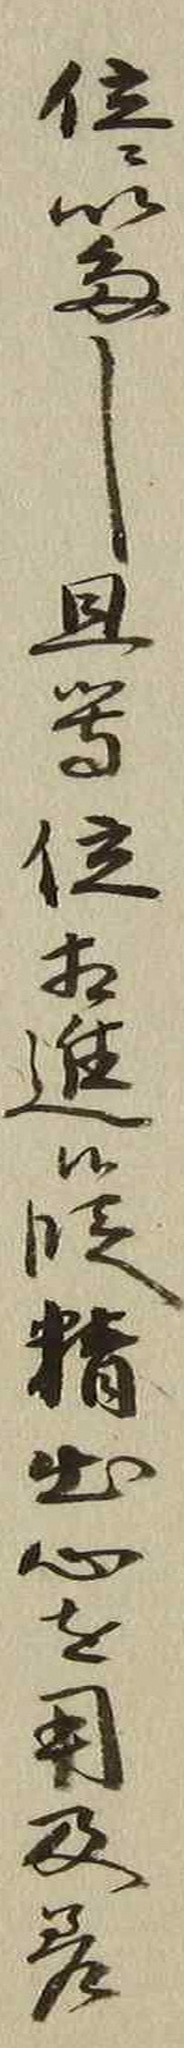位にいたし且等位相進候段精出心を用及差
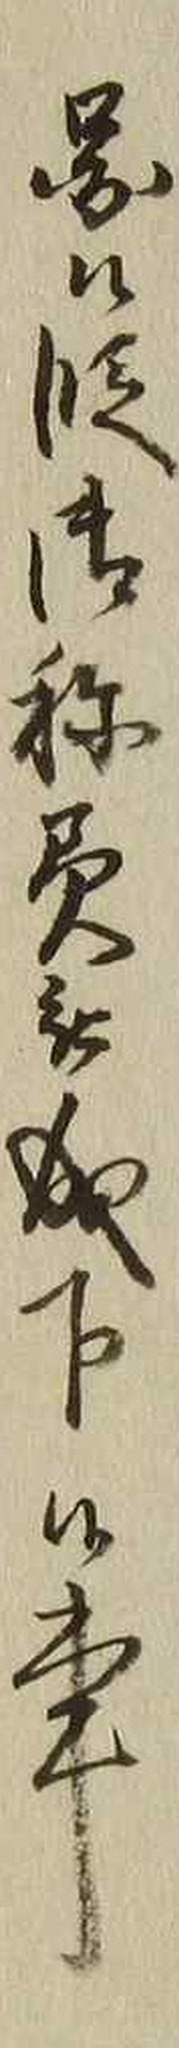図侯段御称美被成下候事
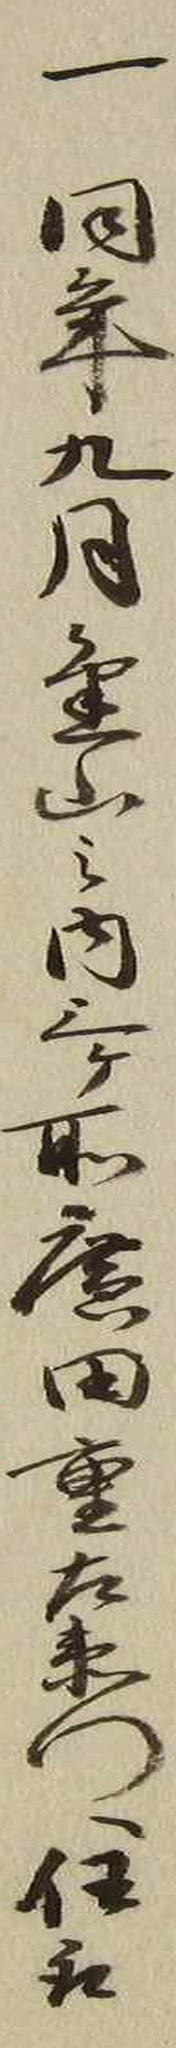一同年九月金山之内三ケ所広田重左衛門へ任取
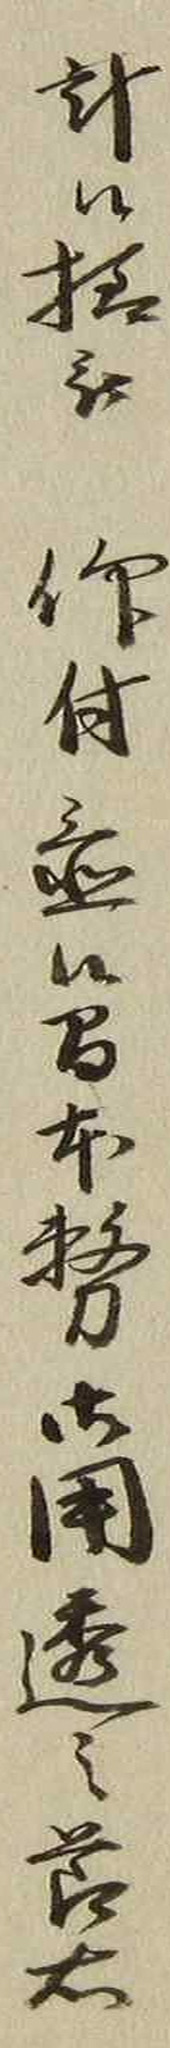計候様被仰付置候間本務御用透之節右
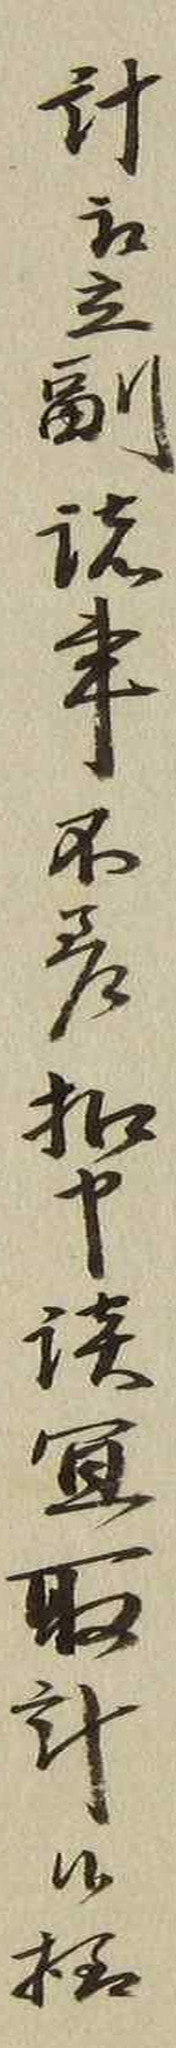計取立副諸事不差扣申談宜取計候様
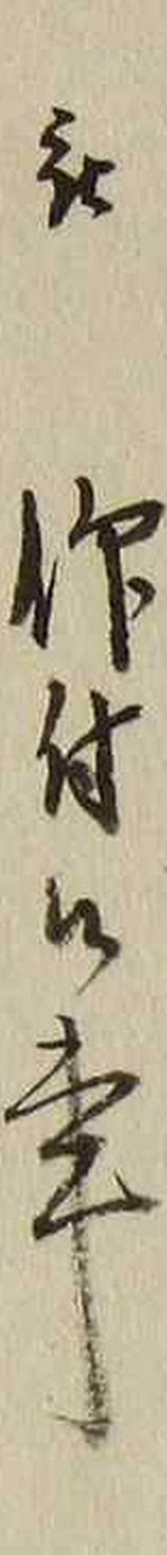被仰付候事
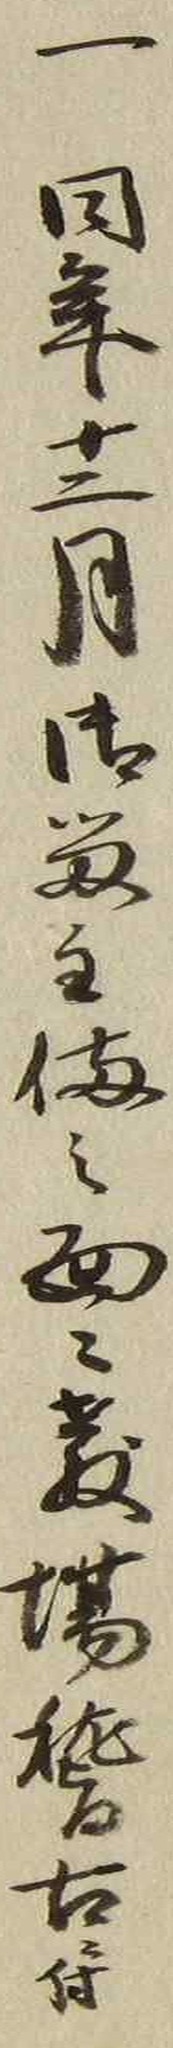一同年十二月御留主備之面々教場稽古に付
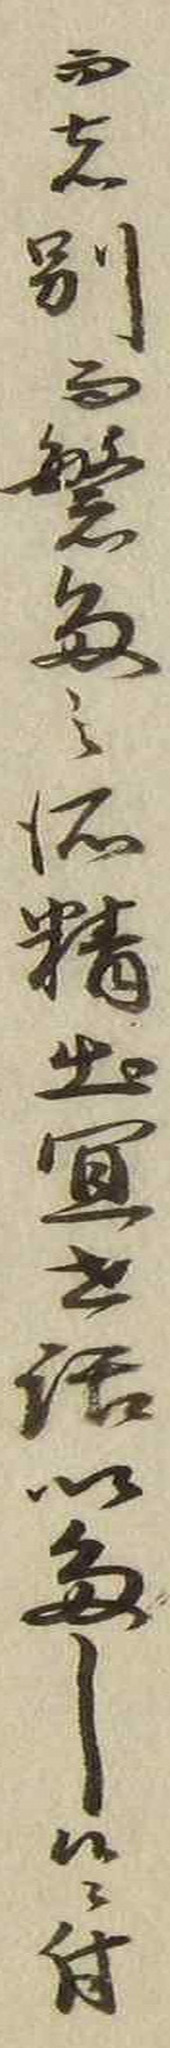而は別而繁多之所精出宜世話いたし候に付
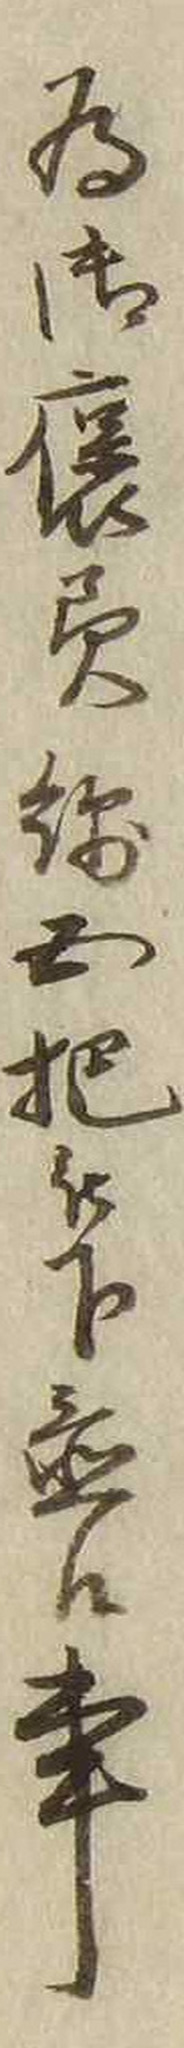為御褒美綿五把被下置候事

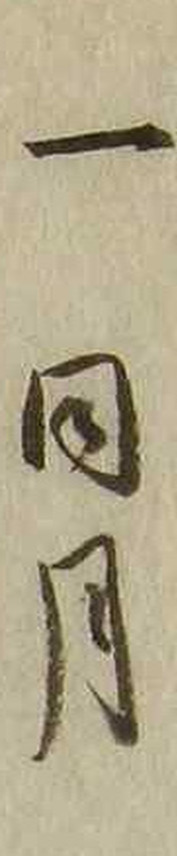一同月
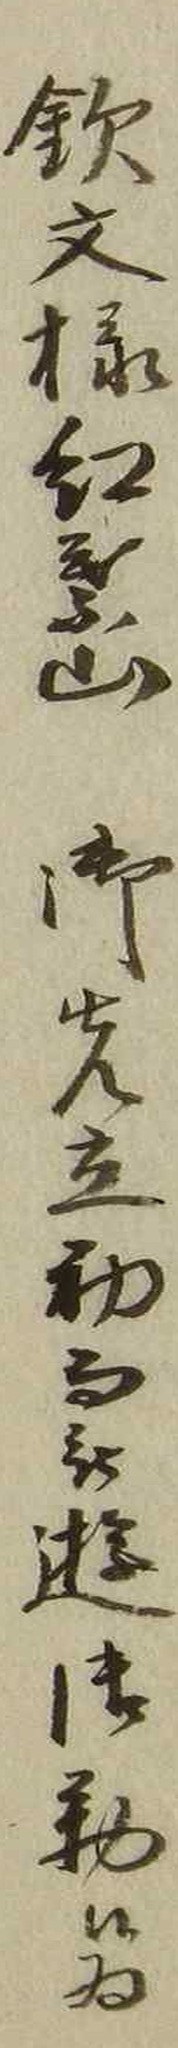欽文様紅葉山御先立初而被遊御勤候為
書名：諸士系譜　巻之133　た之部9
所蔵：会津若松市立会津図書館
